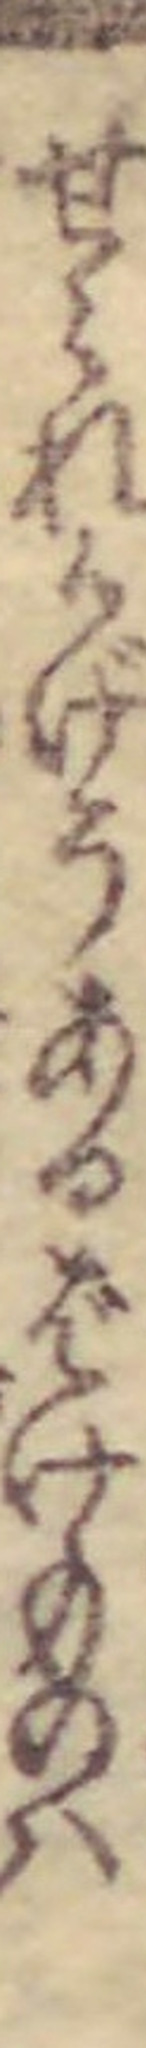せられかげうあるばけものは
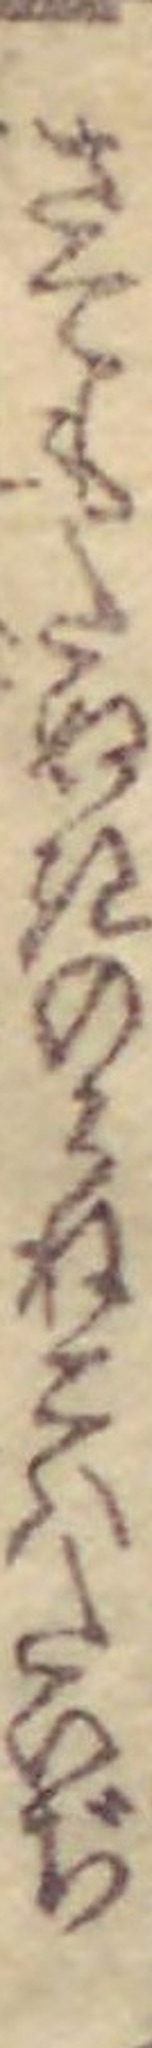さてもたぬきのらねこはたいぢ
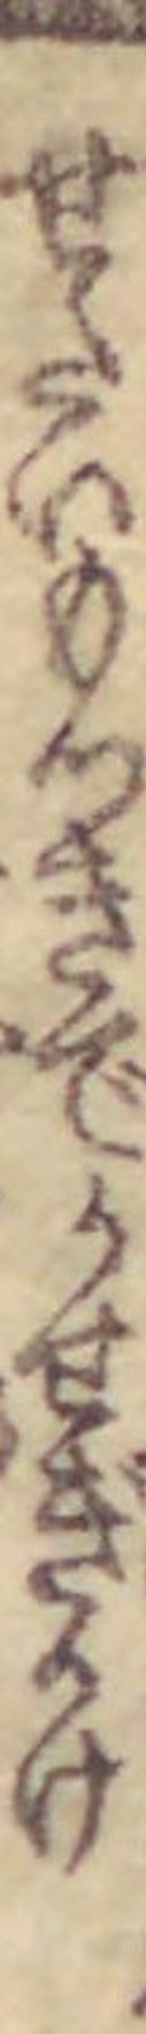せたいもつきでかせぎかけ
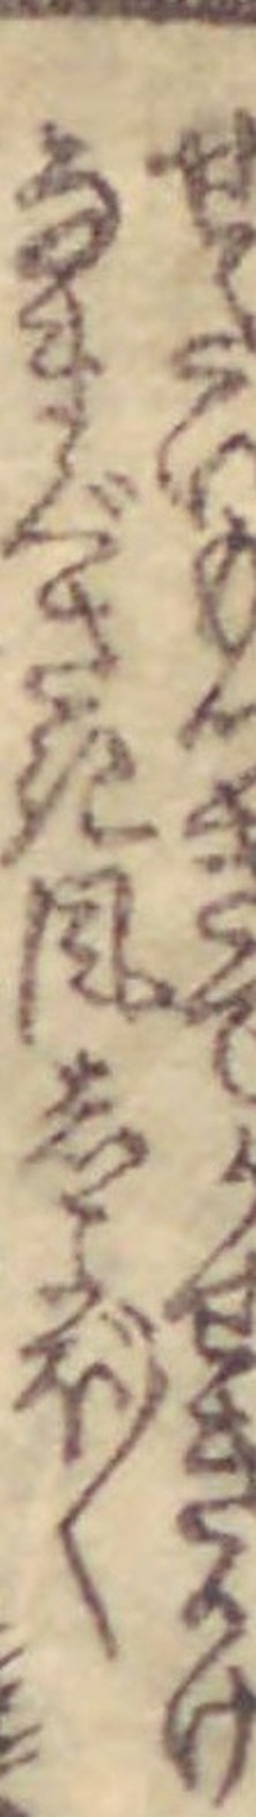なまぐさき風しよぼ〳〵
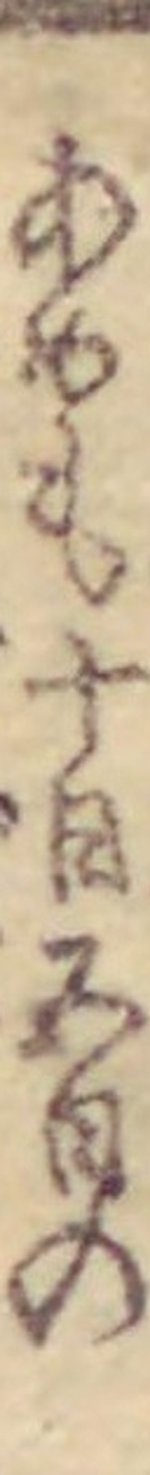あめも十日五日の
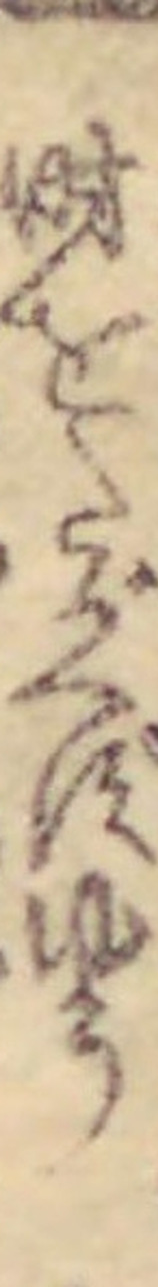時をたがへづゆう
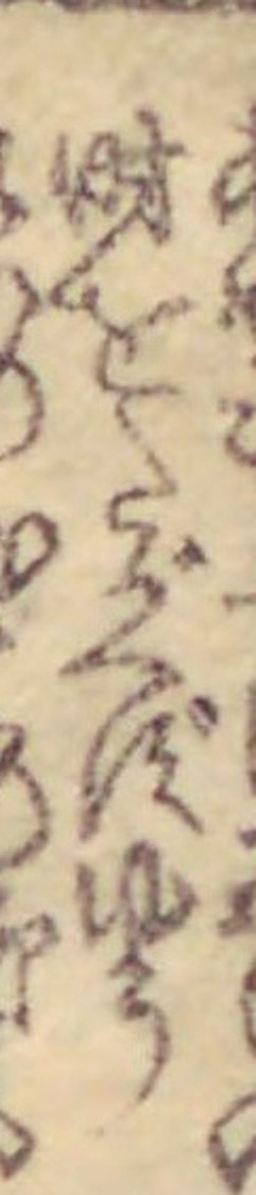時をたがへづゆう
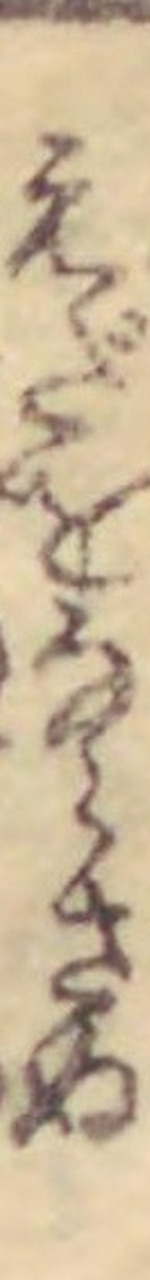えだをならさぬ
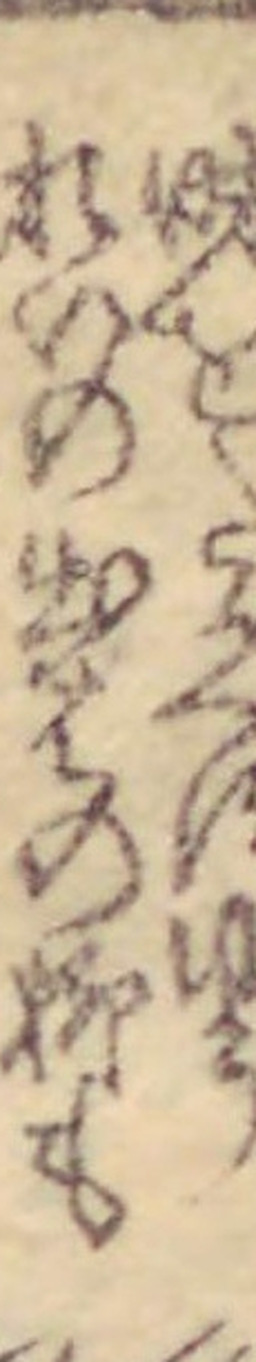れいの出はの柳も
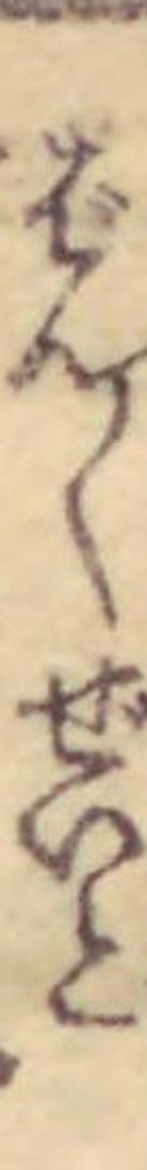ばん〳〵ぜいと
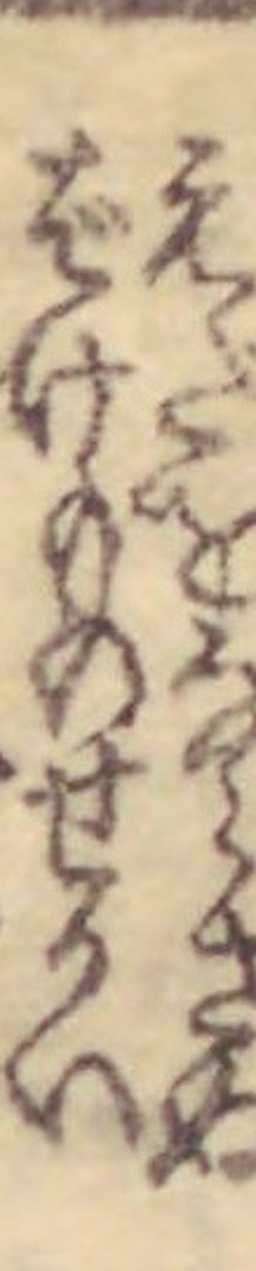ばけものせかい
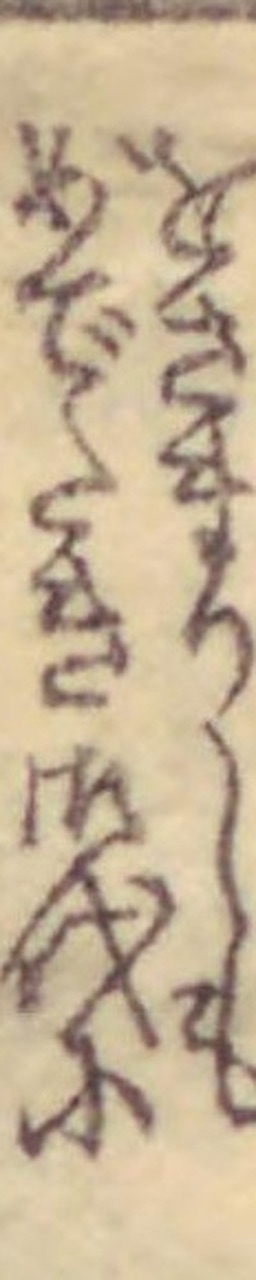めでたき御代に
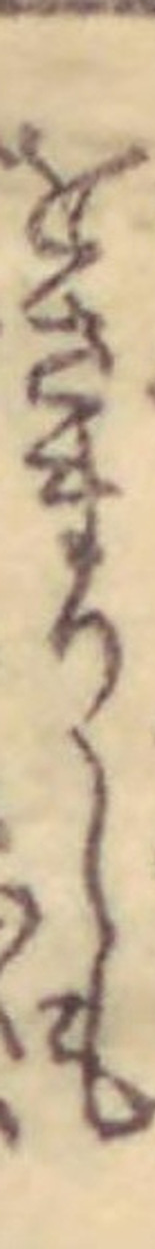をさまりしも
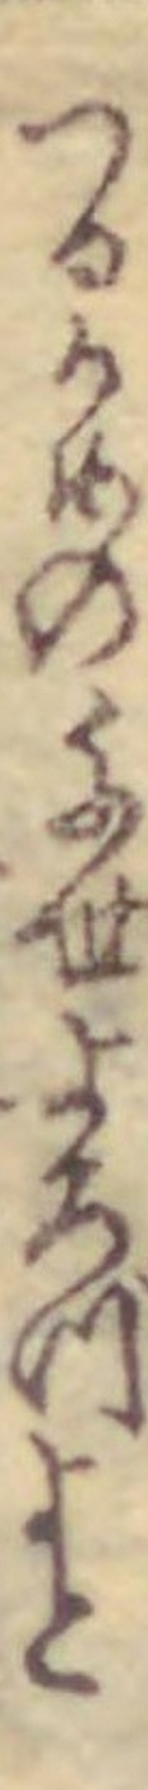つるかめの千世よろづよと
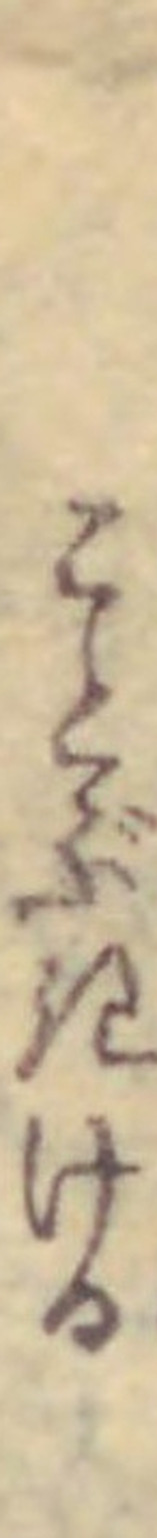ことぶきける
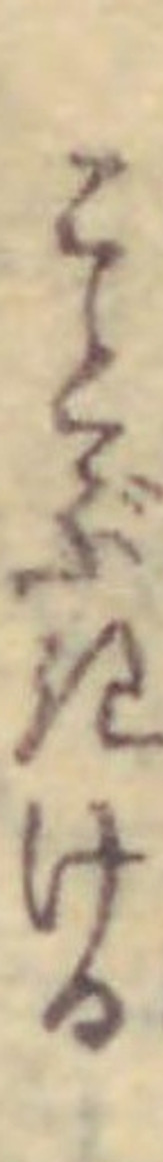ことぶきける
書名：化物世帯氣質
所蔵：国立国会図書館 National Diet Library, JAPAN
